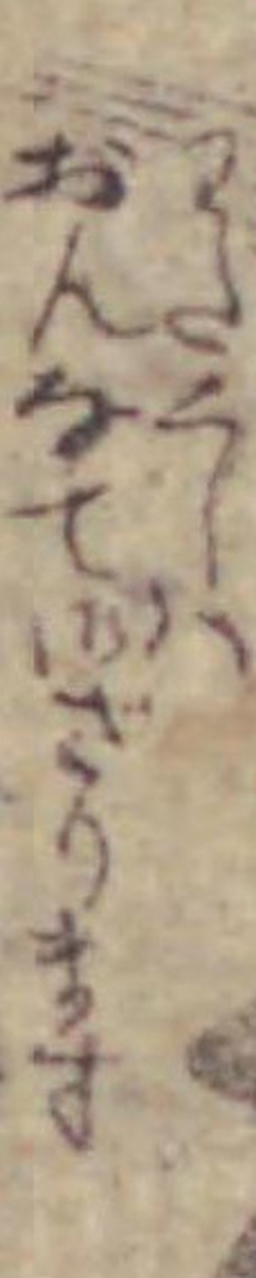おんなて御ざります
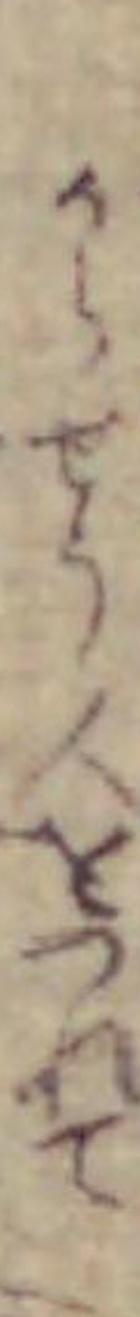からせう人をつれて
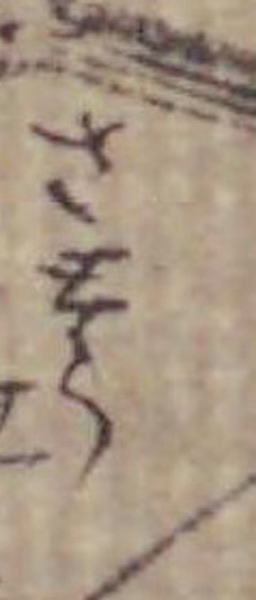さとう
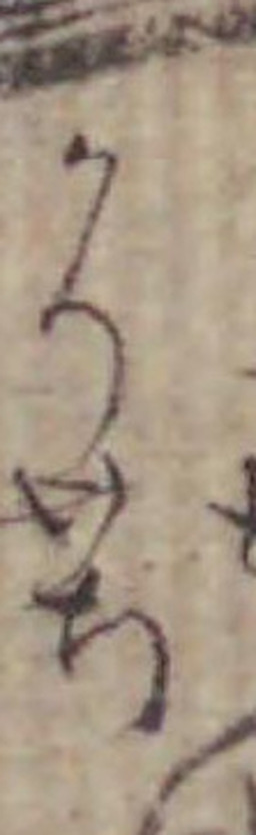かりいち
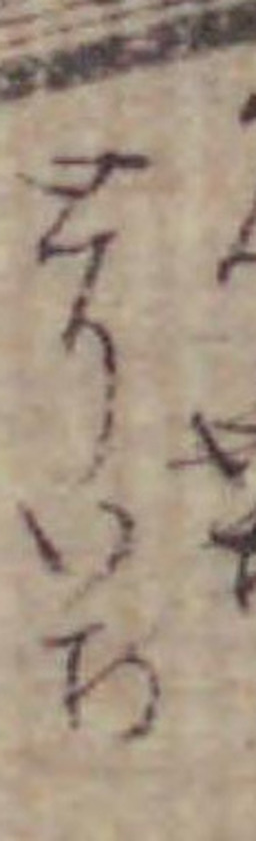とりいち

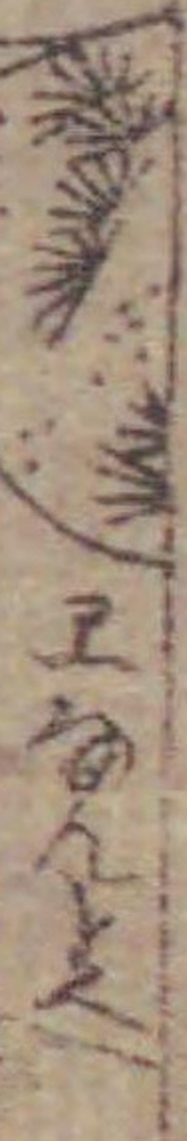ヱなんとへ
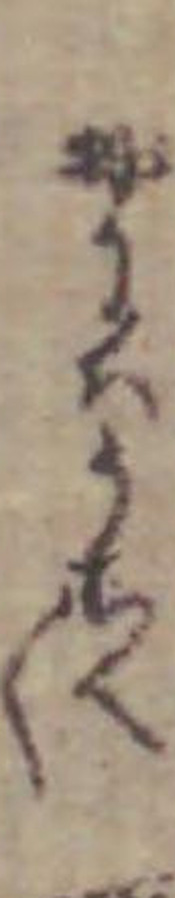おにはうちへ
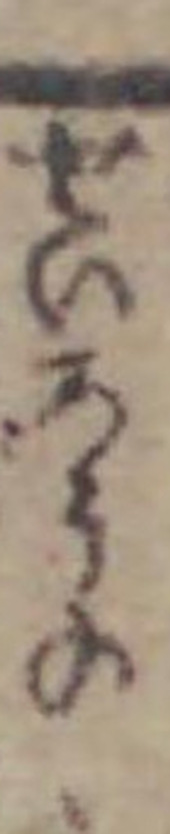せいろうの
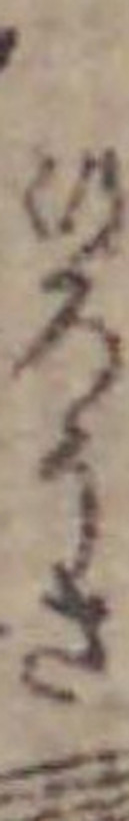ひろうさ
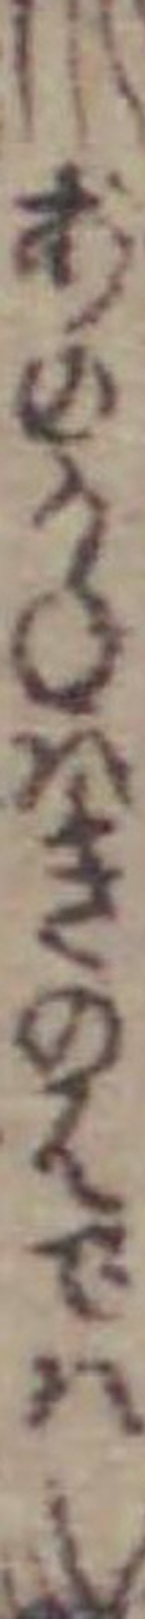あのかねはきのはでは
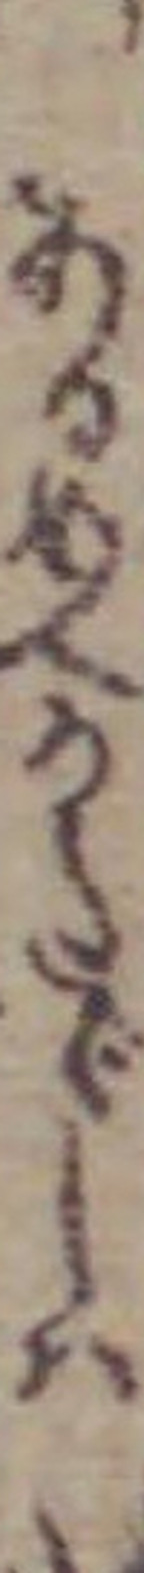あるめへかたゞしは
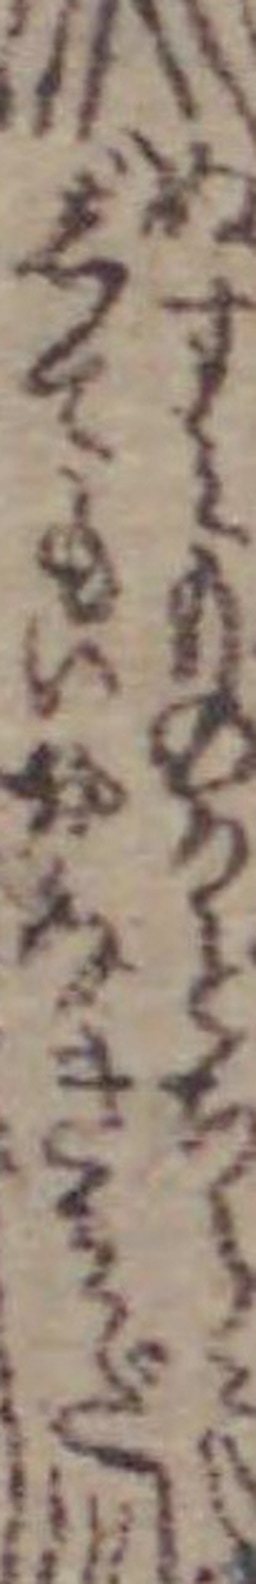してもいやなきみだ
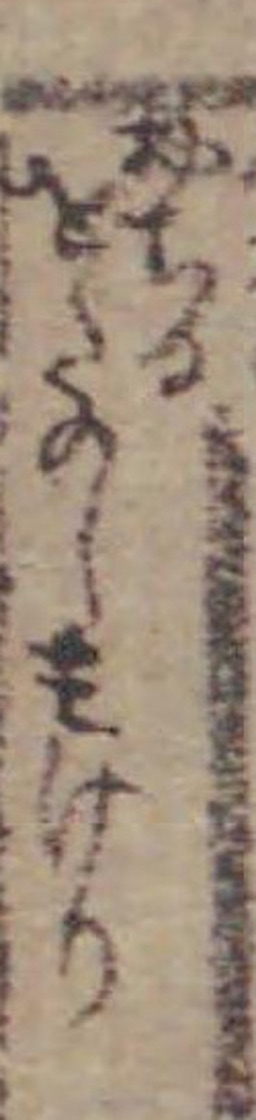をたのしみけり

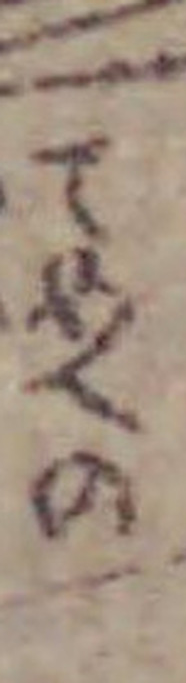てめへの
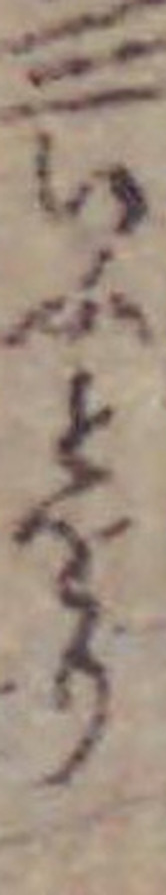いふとをり
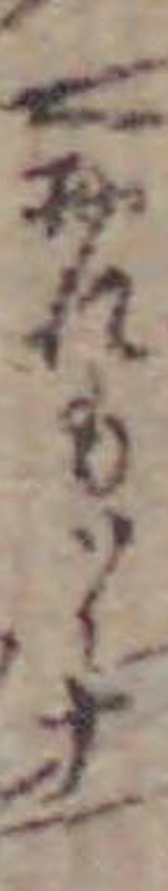おれもソレナ
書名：莫切自根金生木 : 3巻
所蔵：国立国会図書館 National Diet Library, JAPAN
